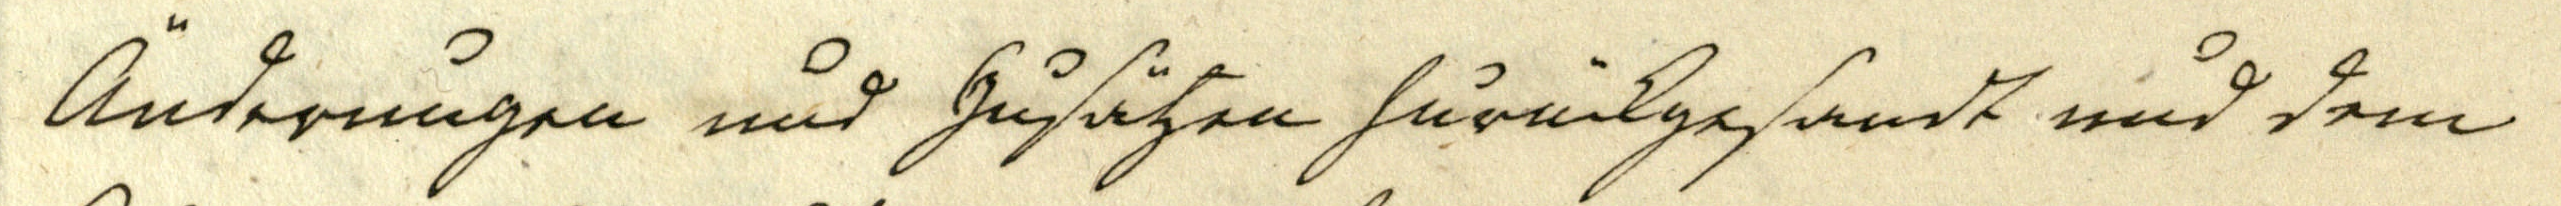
Änderungen und Zusätzen zurückgesandt und dem
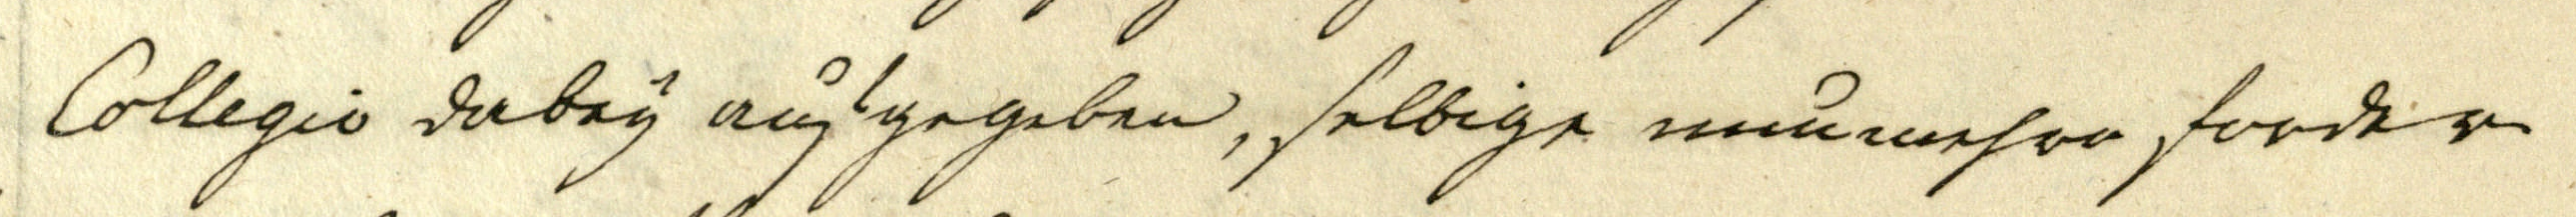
Collegio dabeÿ aufgegeben, selbige nunmehro forder¬
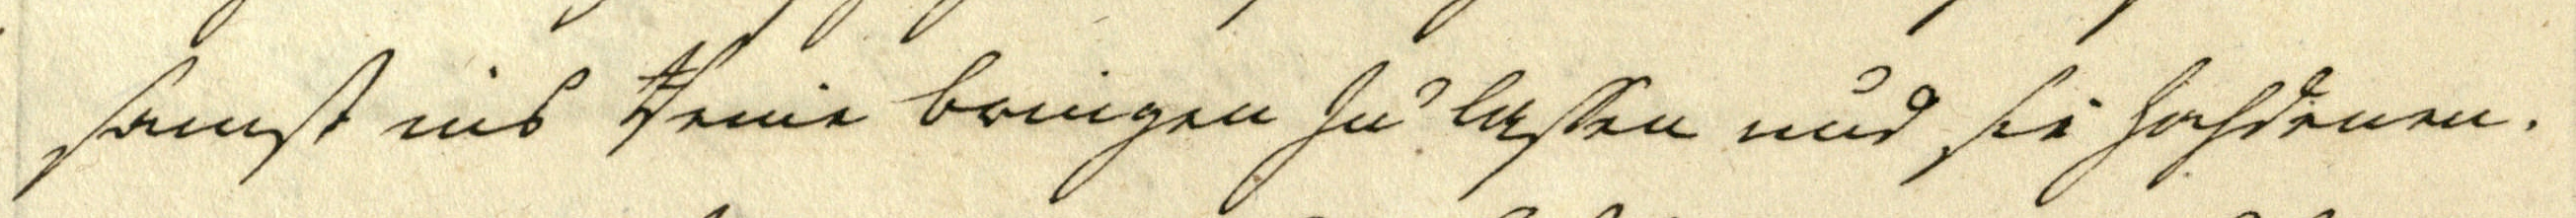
samst ins Reine bringen zu lassen und sie hochdenen¬
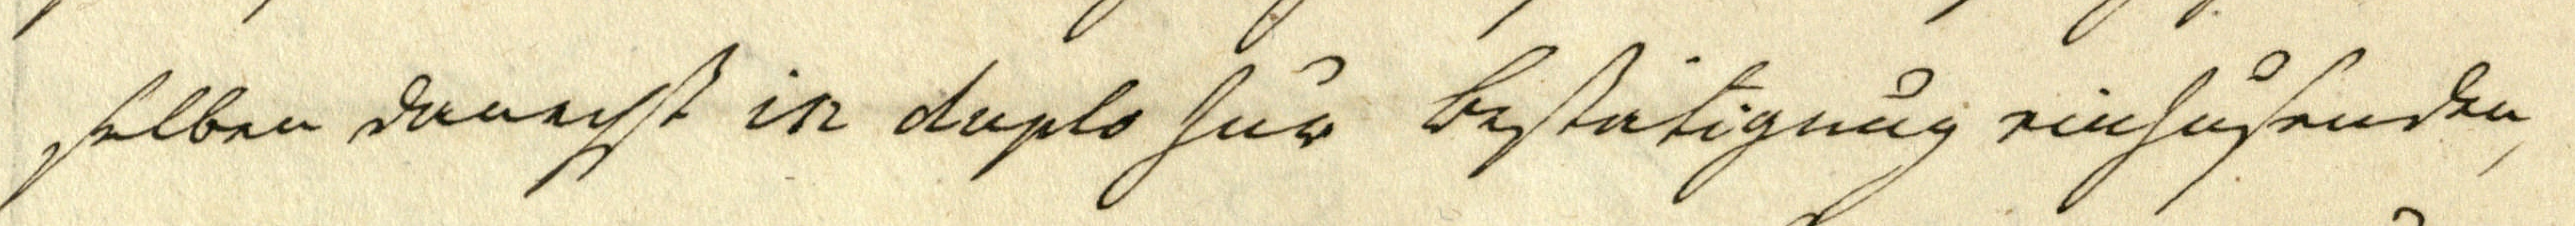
selben danechst in duplo zur Bestätigung einzusenden,
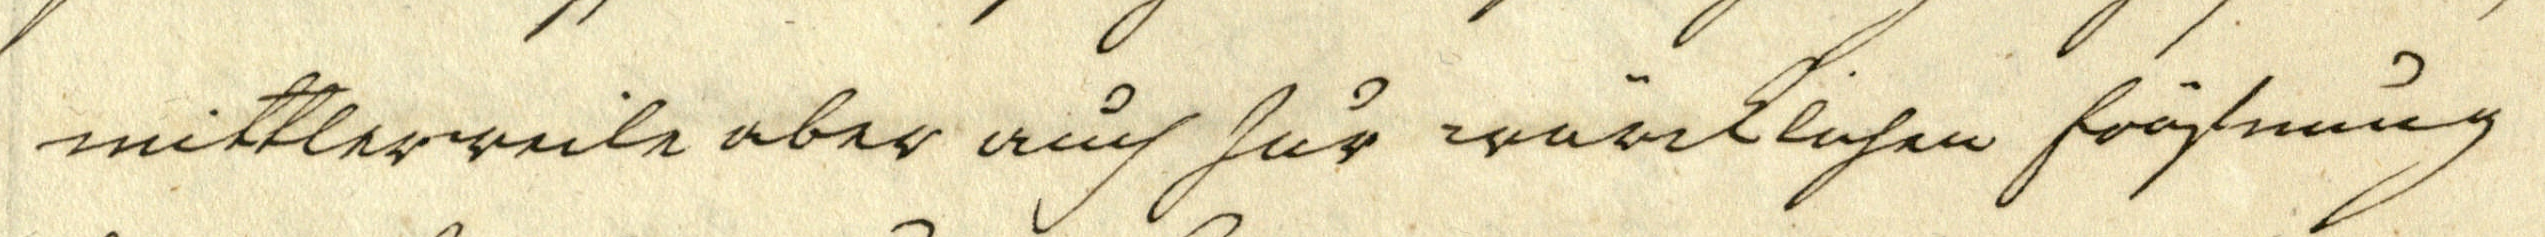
mittlerweile aber auch zur würcklichen Eröfnung
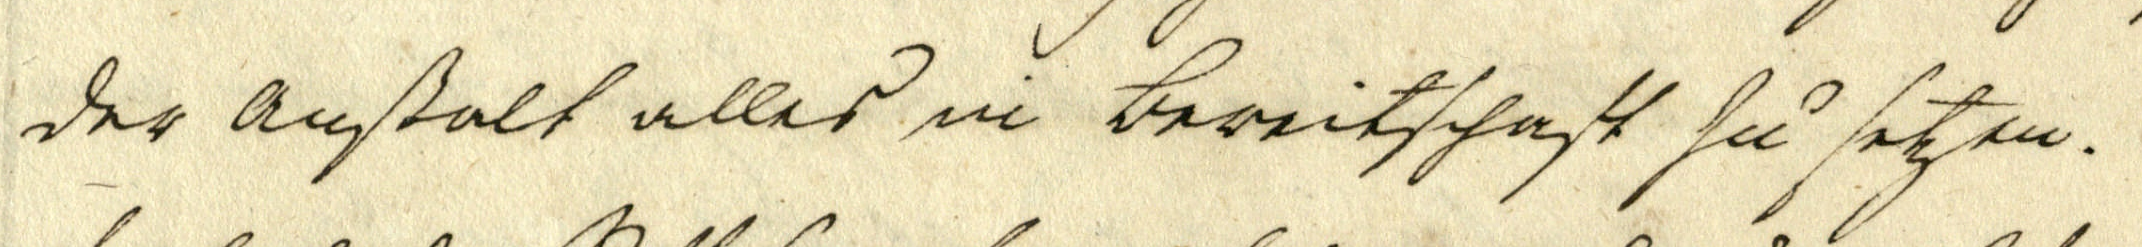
der Anstalt alles in Bereitschaft zu setzen.
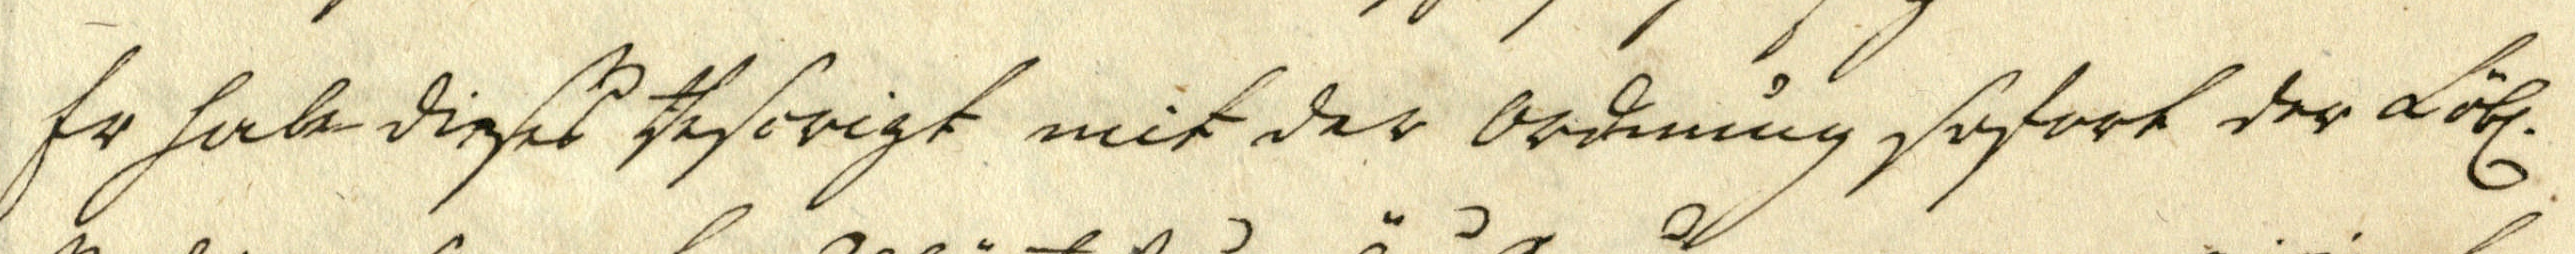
Er habe dieses Rescript mit der Ordnung sofort der Löbl.
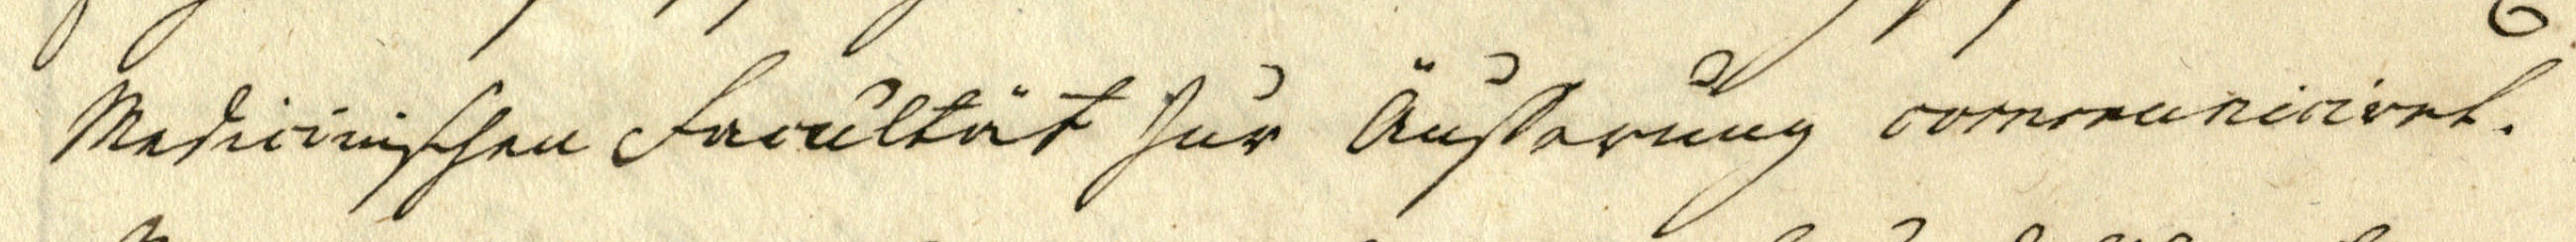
Medicinischen Facultät zur Äusserung communiciret.
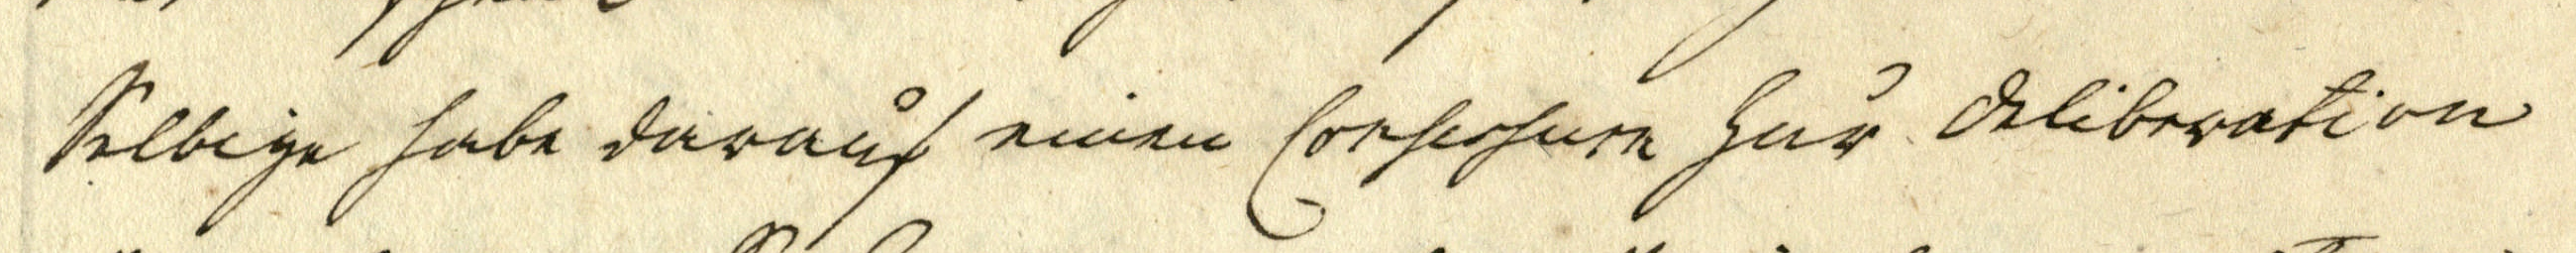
Selbige habe darauf einen Consessum zur Deliberation
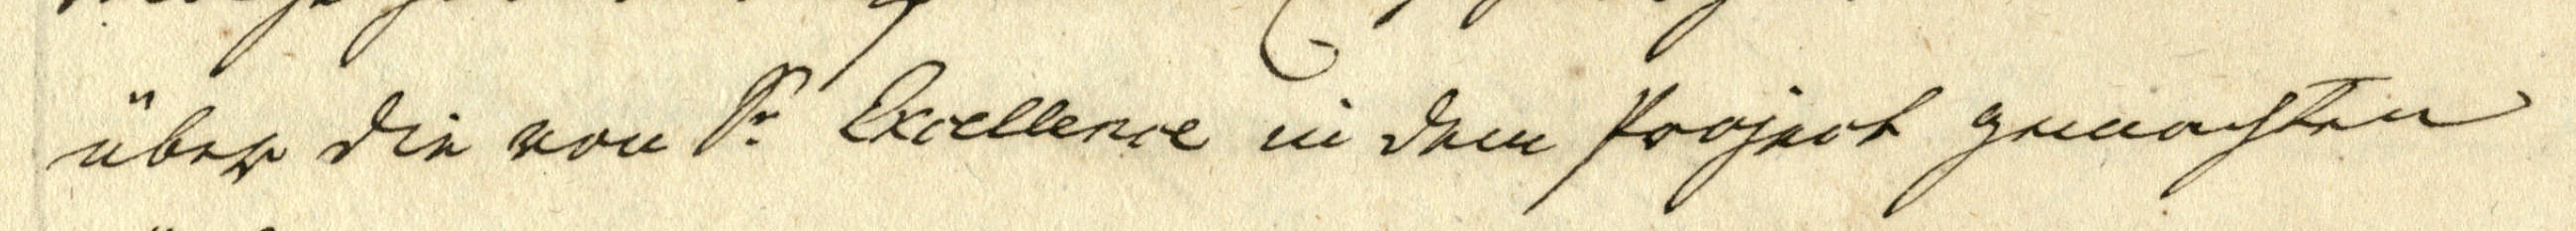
über die von Sr. Excellence in dem Project gemachten
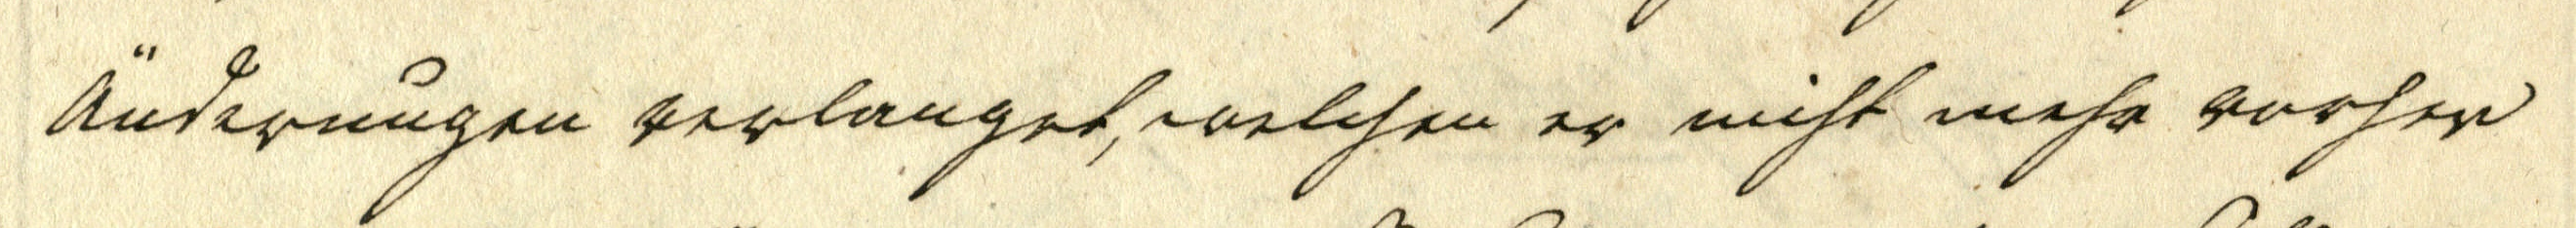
Änderungen verlanget, welchen er nicht mehr vorher
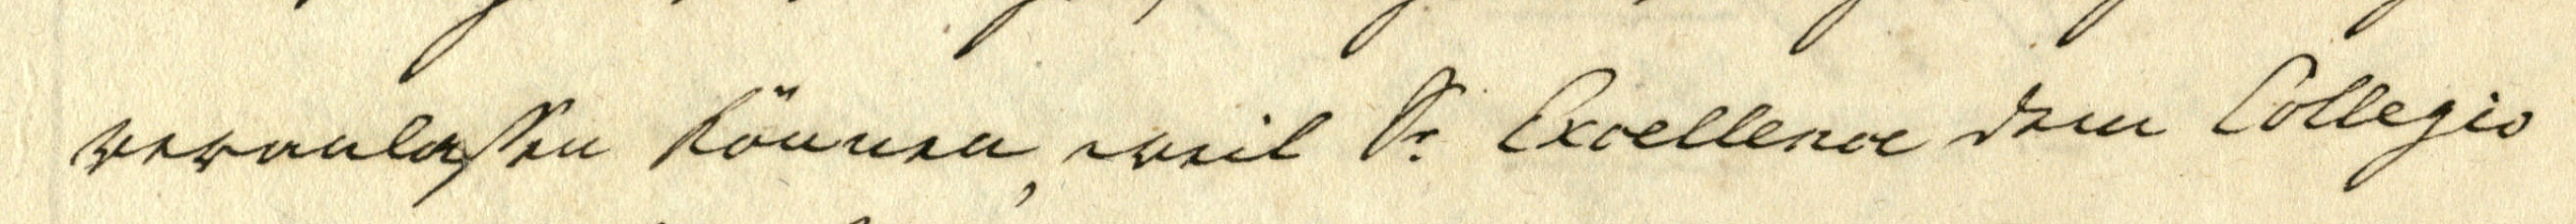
veranlassen können, weil Sr. Excellence dem Collegio
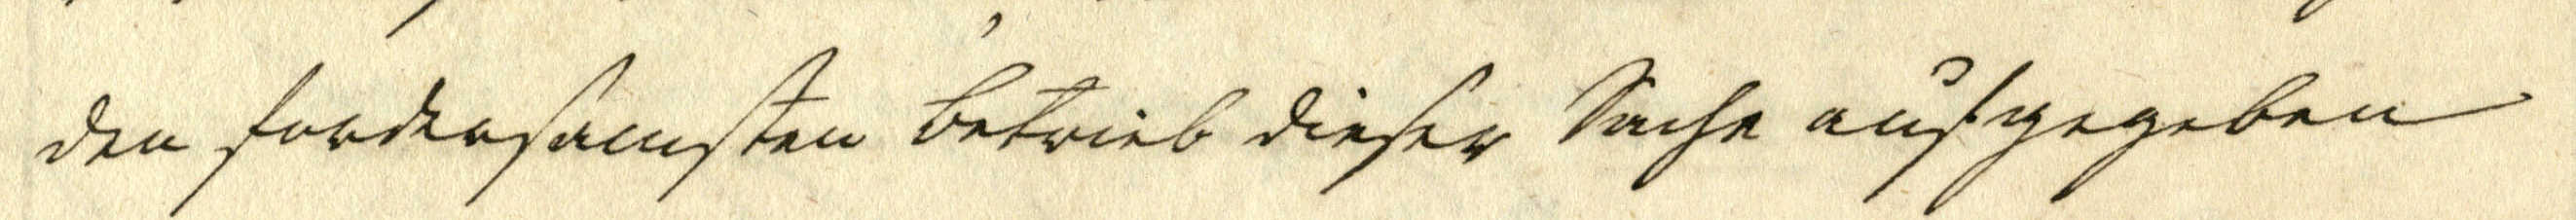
den fordersamsten Betrieb dieser Sache aufgegeben
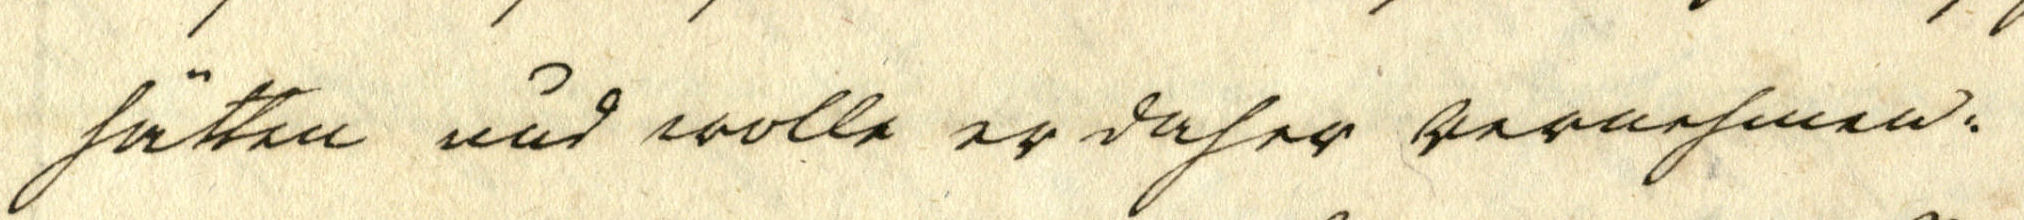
hätten und wolle er daher vernehmen:
